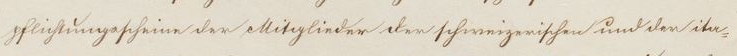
pflichtungsscheine der Mitglieder der schweizerischen und der ita-
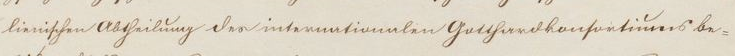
lienischen Abtheilung des internationalen Gotthardkonsortiums be-
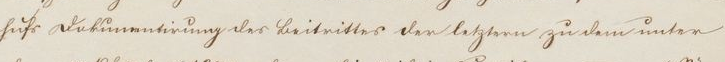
hufs Dokumentirung des Beitrittes der letztern zu dem unter
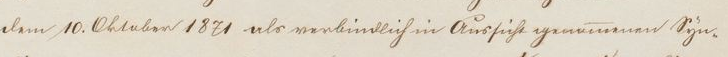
dem 10. Oktober 1871 als verbindlich in Aussicht genommenen Syn-
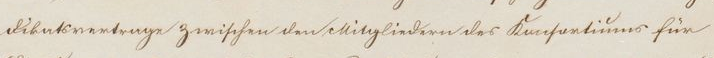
dikatsvertrage zwischen den Mitgliedern des Konsortiums für
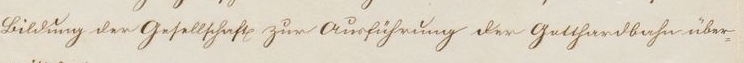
Bildung der Gesellschaft zur Ausführung der Gotthardbahn über-
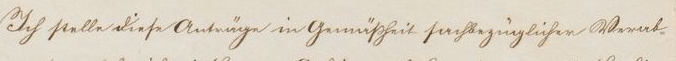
Ich stelle diese Anträge in Gemäßheit sachbezüglicher Verab-
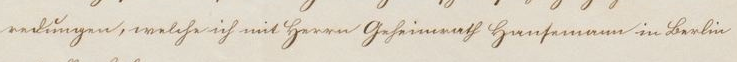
redungen, welche ich mit Herrn Geheimrath Hansemann in Berlin
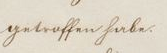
getroffen habe.
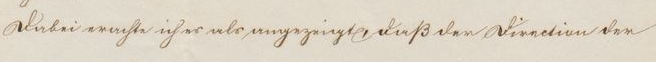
Dabei erachte ich es als angezeigt, daß der Direction der
